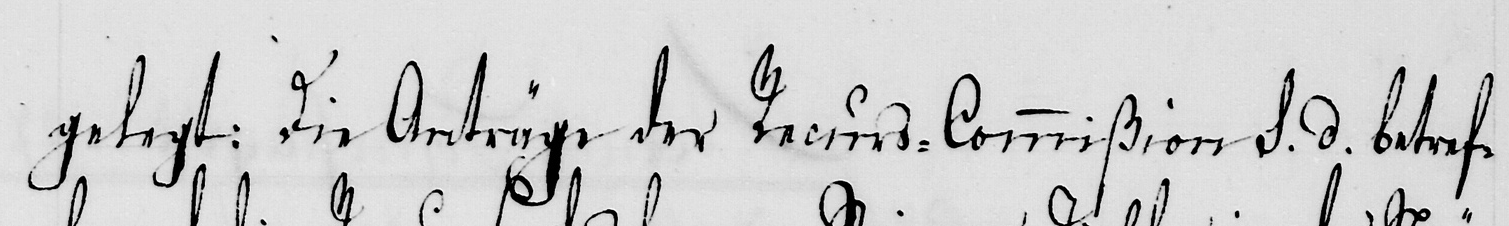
gelegt: Die Anträge der Recurs-Commißion S. d. bet¬
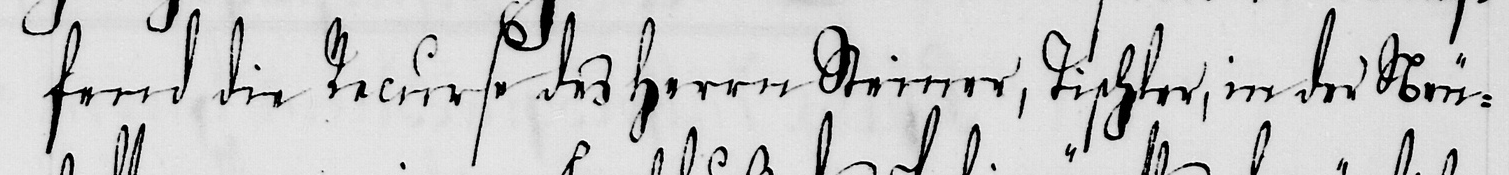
fend die Recurse des Herrn Steiner, Tischler, in der Neus¬
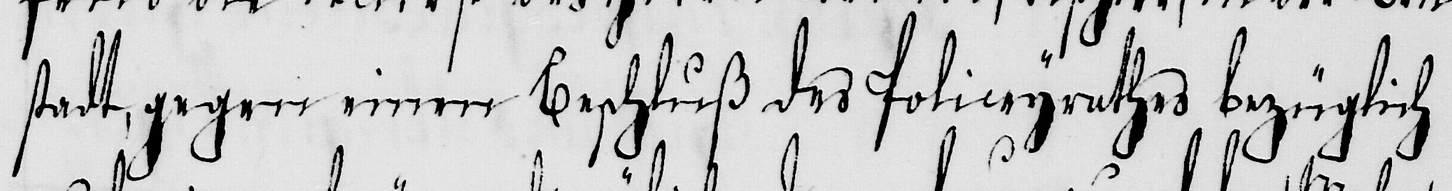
tadt, gegen einen Beschluß des Policeyrathes bezüglich
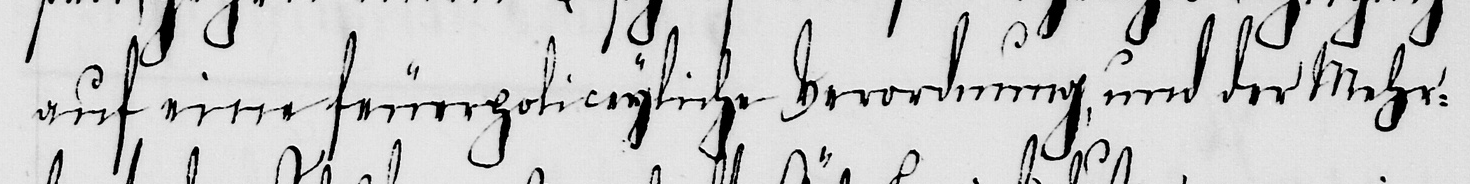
auf eine feuerpoliceyliche Verordnung, und der Mehr¬
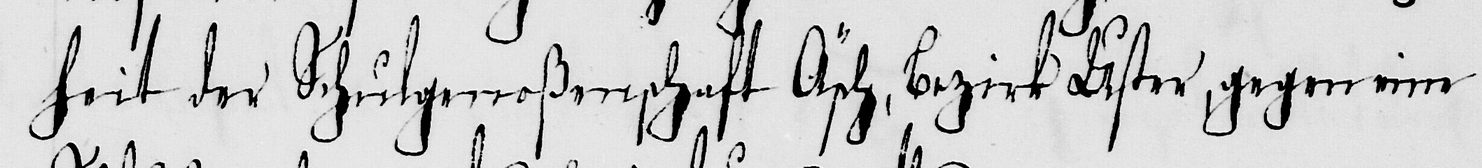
heit der Schulgenoßenschaft Äsch, Bezirk Uster, gegen eine
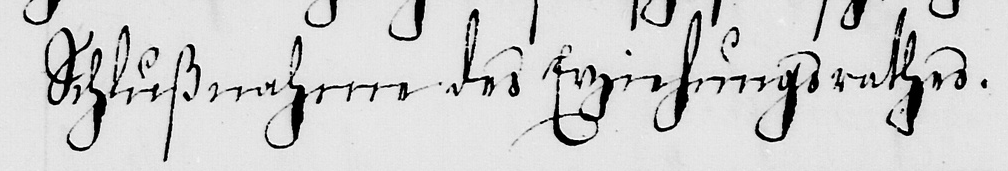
Schlußnahme des Erziehungsrathes.
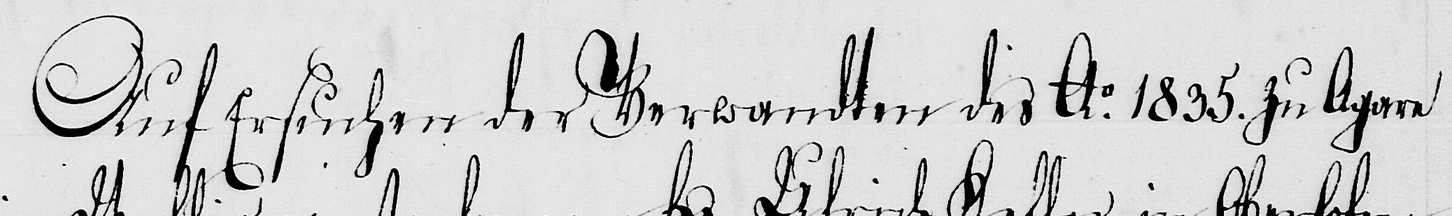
Auf Ersuchen der Verwandten des Ao. 1835. zu Agare
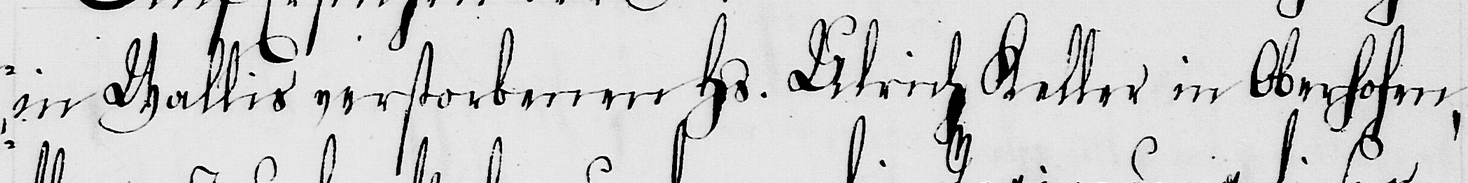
in Wallis verstorbenen Hs. Ulrich Keller in Oberhofen,
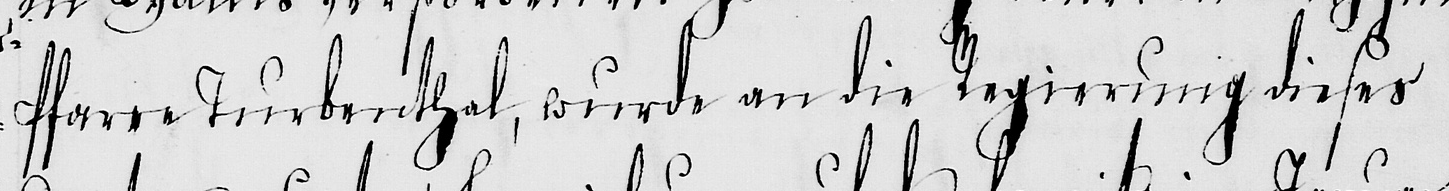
Pfarre Turbenthal, wurde an die Regierung dieses
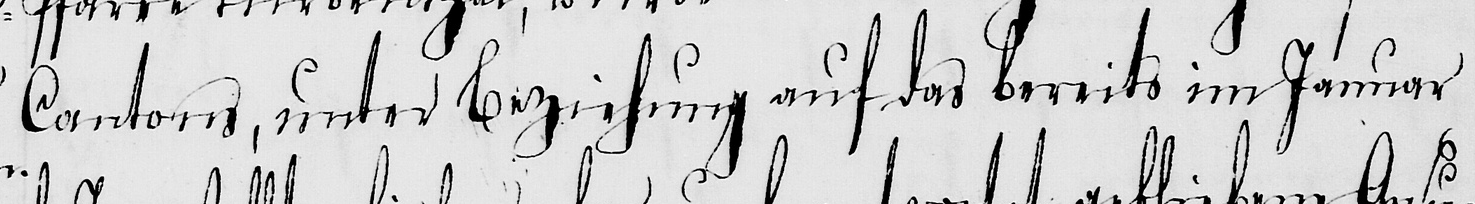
Cantons, unter Beziehung auf das bereits im Januar
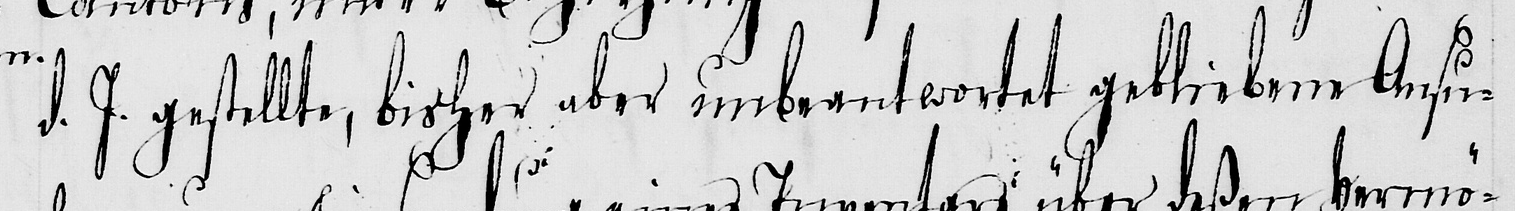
J. gestellte, bisher aber unbeantwortet gebliebene Ansu¬
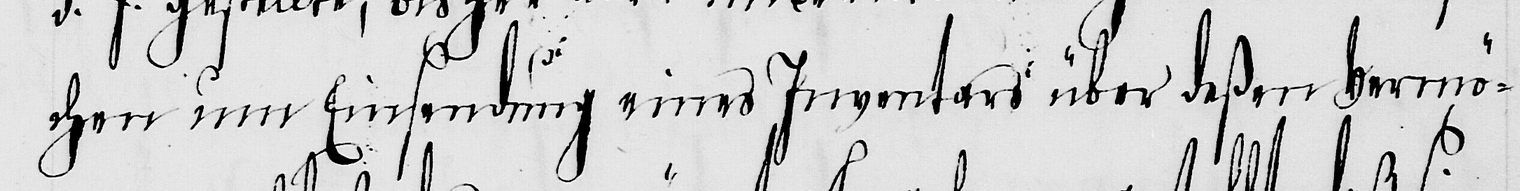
chen um Einsendung eines Inventars über deßen Vermö¬
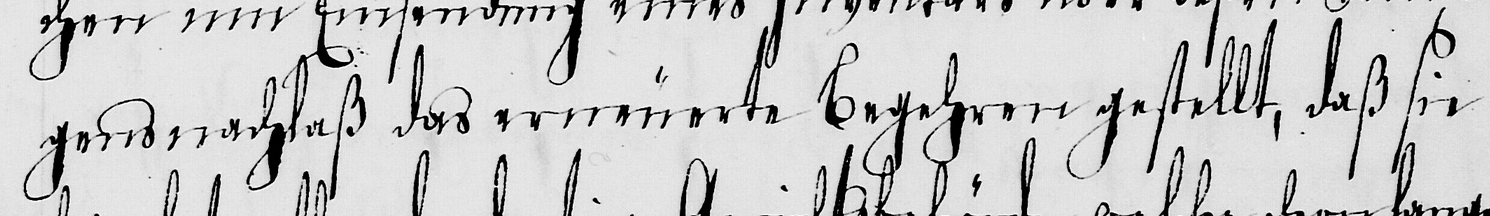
gensnachlaß das erneuerte Begehren gestellt, daß sie
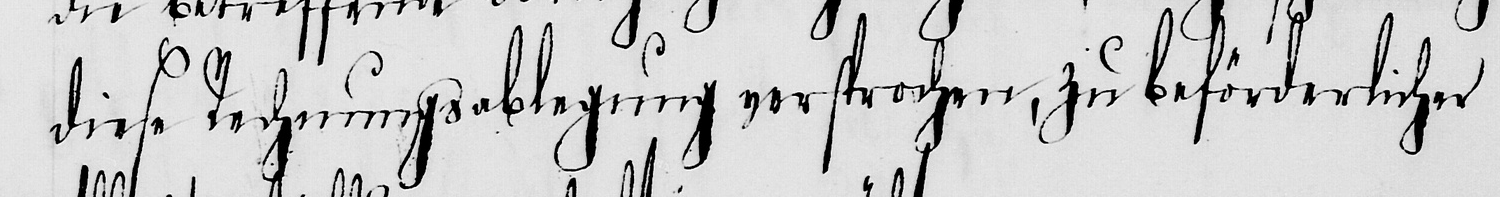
diese Rechnungsablegung versprochen, zu beförderlicher
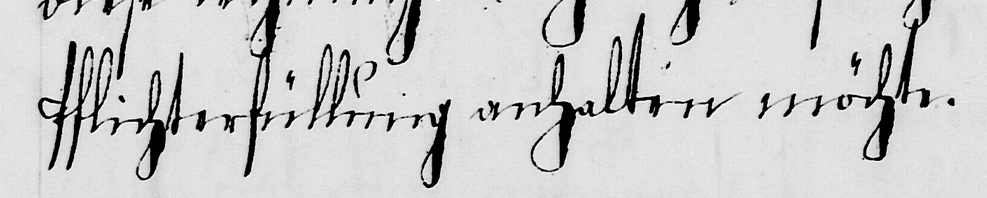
Pflichterfüllung anhalten möchte.
